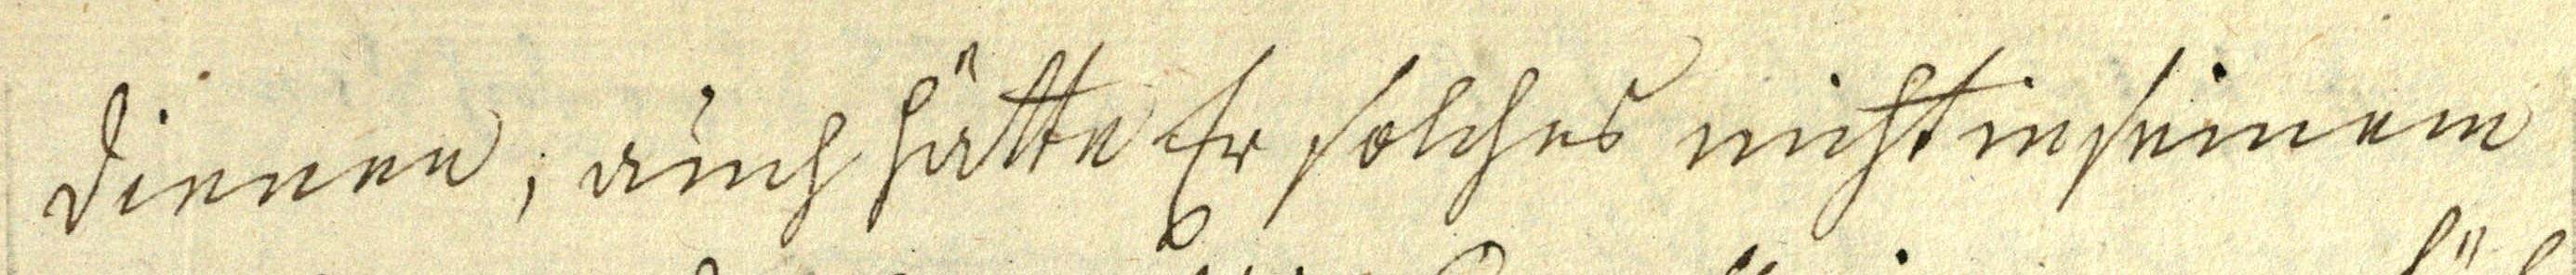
dienen, auch hätte Er solches nicht in seinem
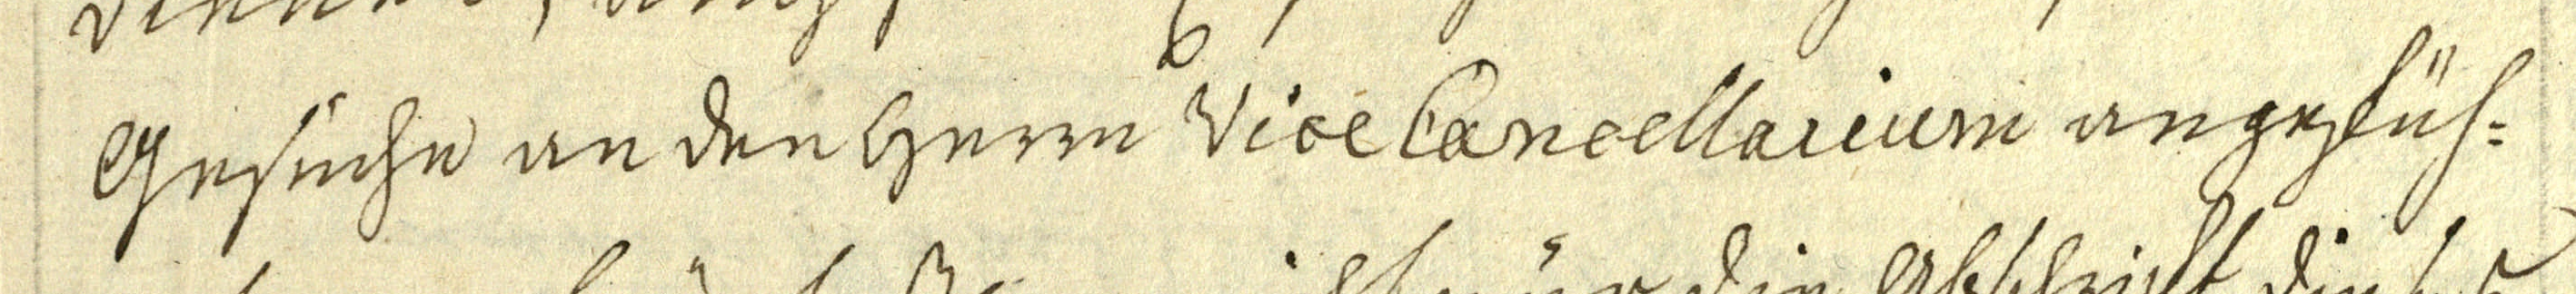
Gesuche an den Herrn ViceCancellarium angefüh¬
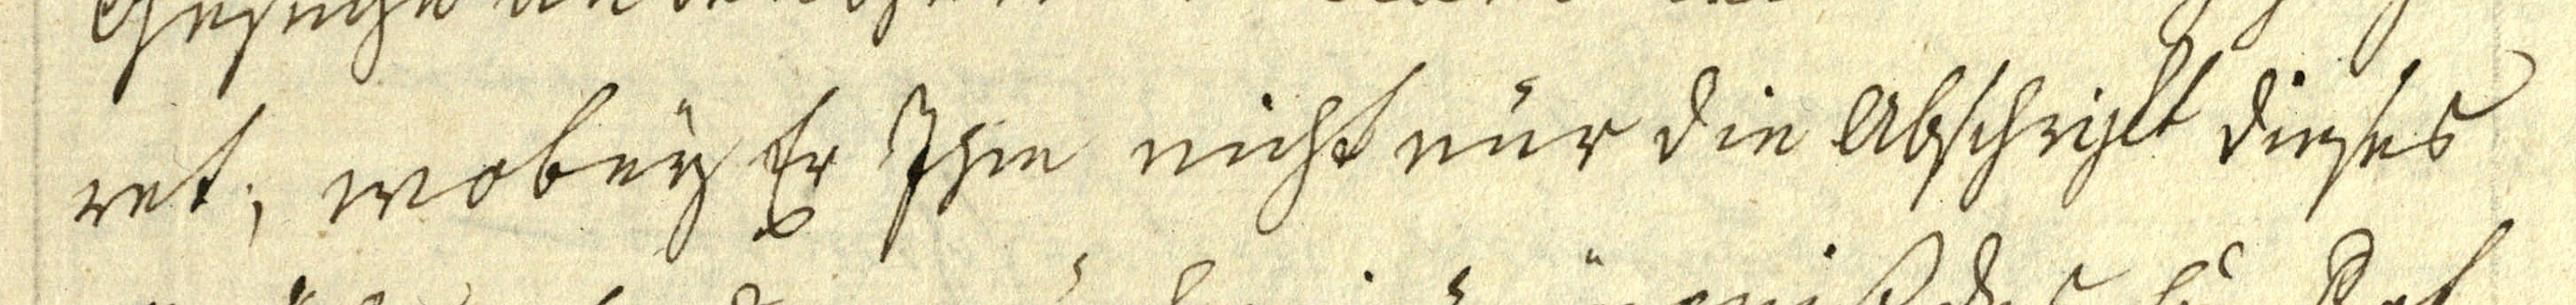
ret, wobeÿ Er Ihm nicht nur die Abschrift dieses
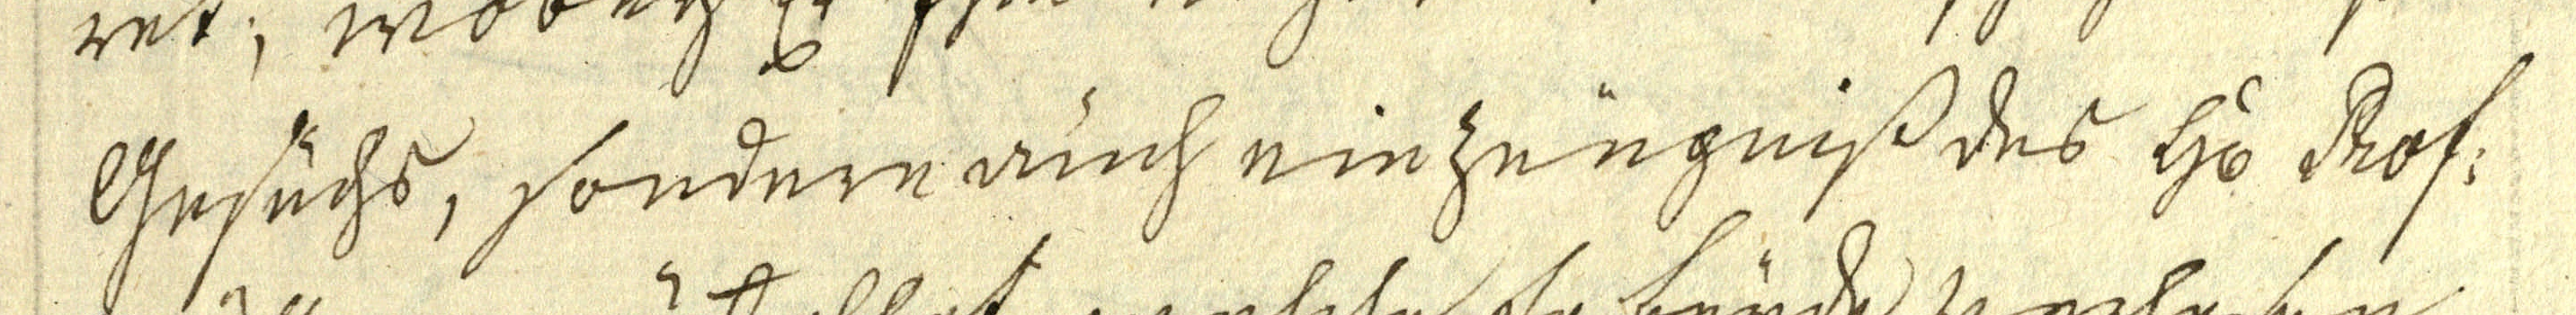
Gesuchs, sondern auch ein zeugniß des H Prof.
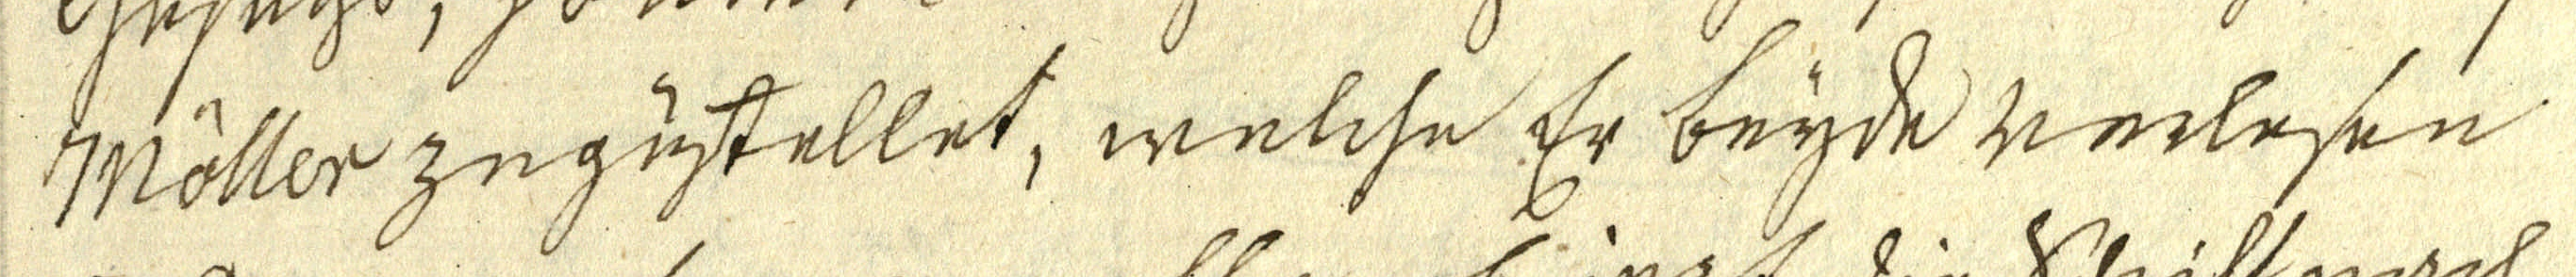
Möller zugestellet, welche Er beÿde verlesen
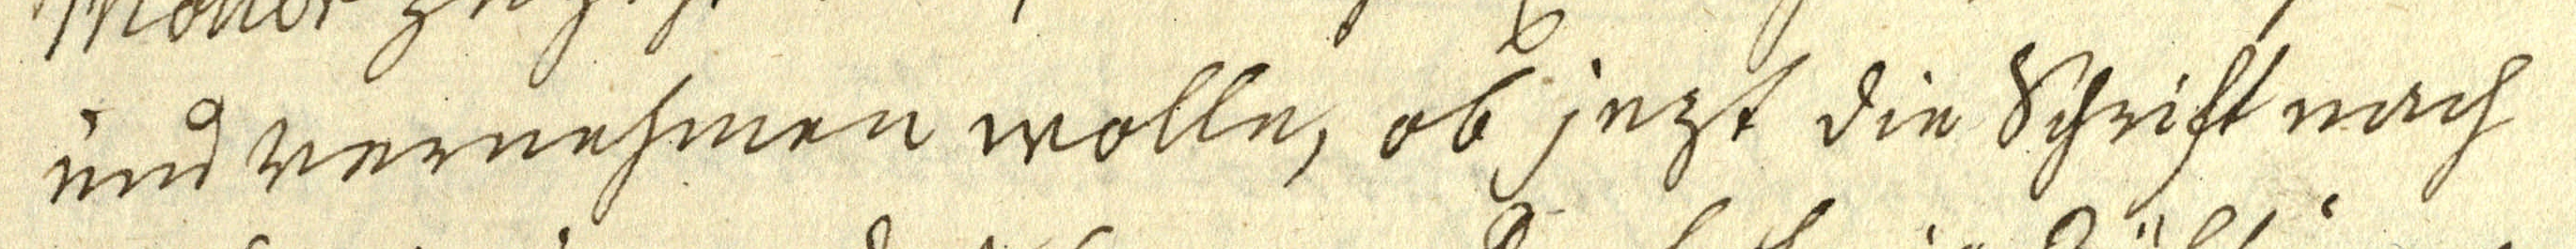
und vernehmen wolle, ob jezt die Schrift nach
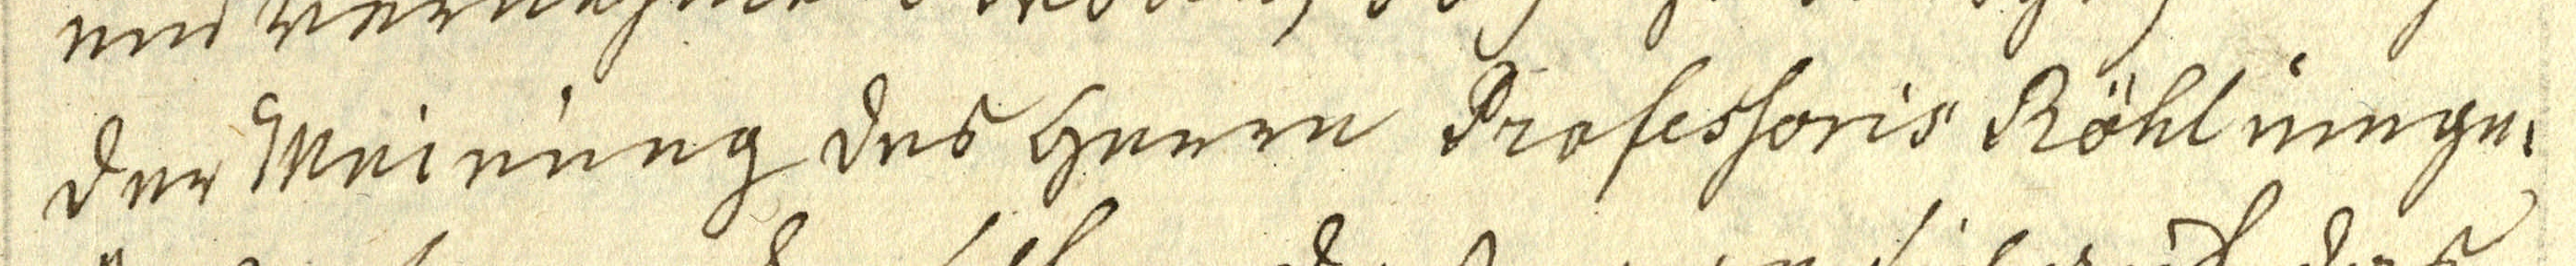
der Meinung des Herrn Professoris Röhl umge¬
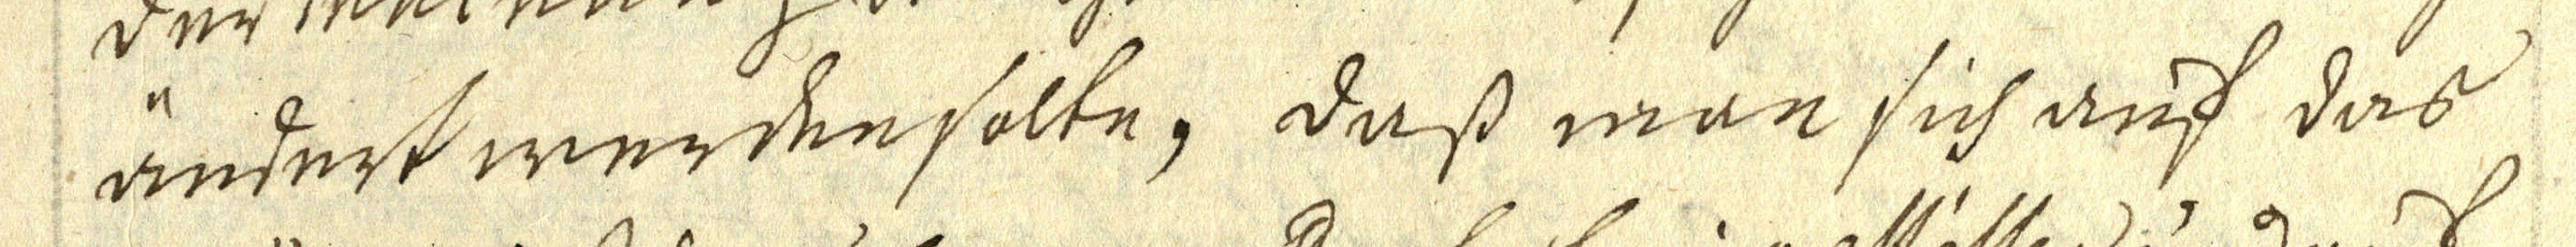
ändert werden solte, daß man sich auf das
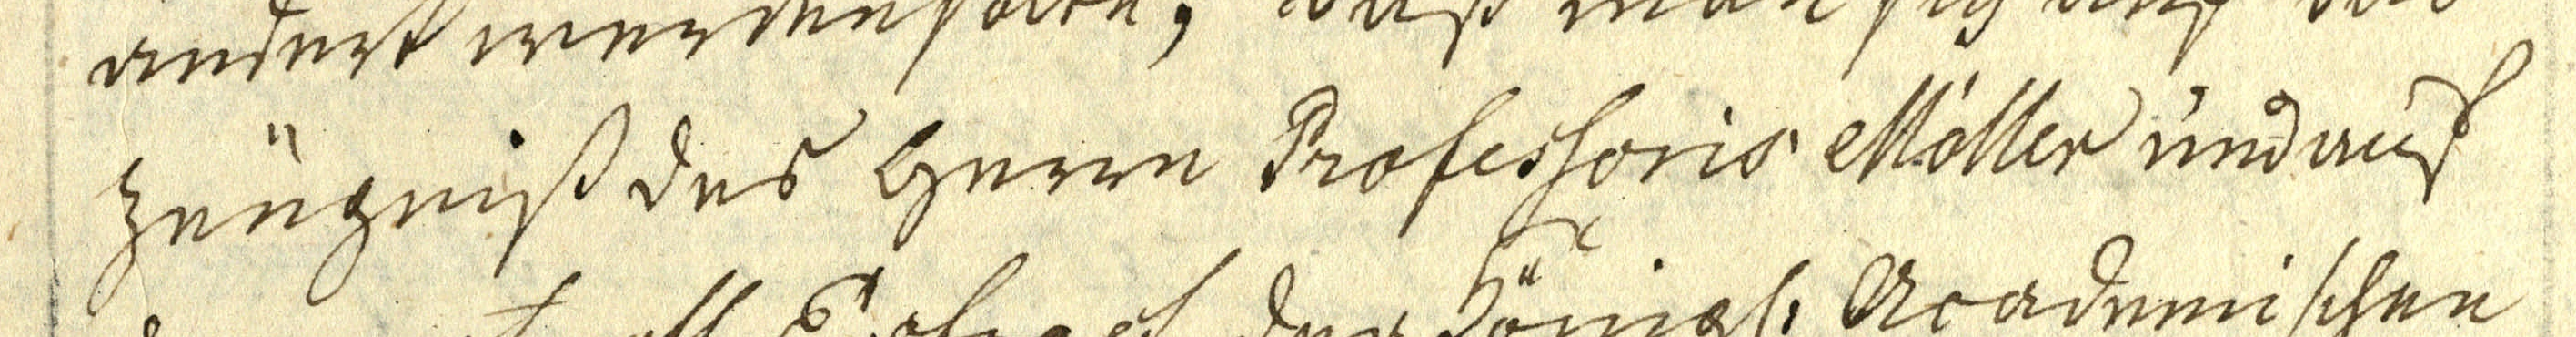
Zeugniß des Herrn Professoris Möller und auf
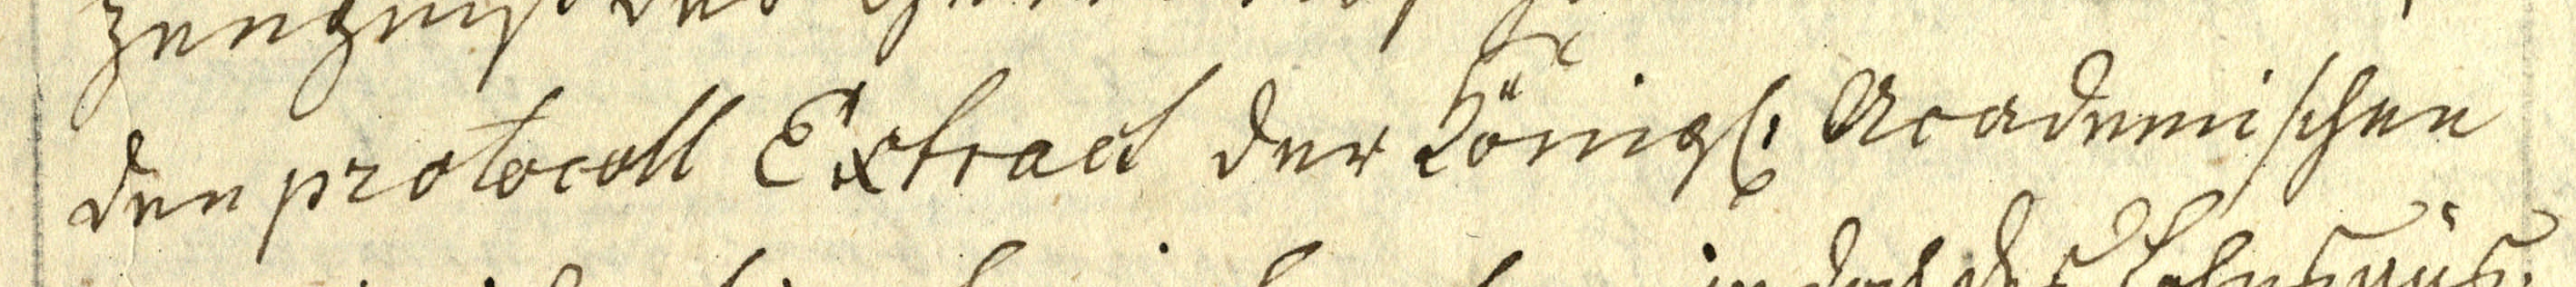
den protocoll Extract der Königl. Academischen
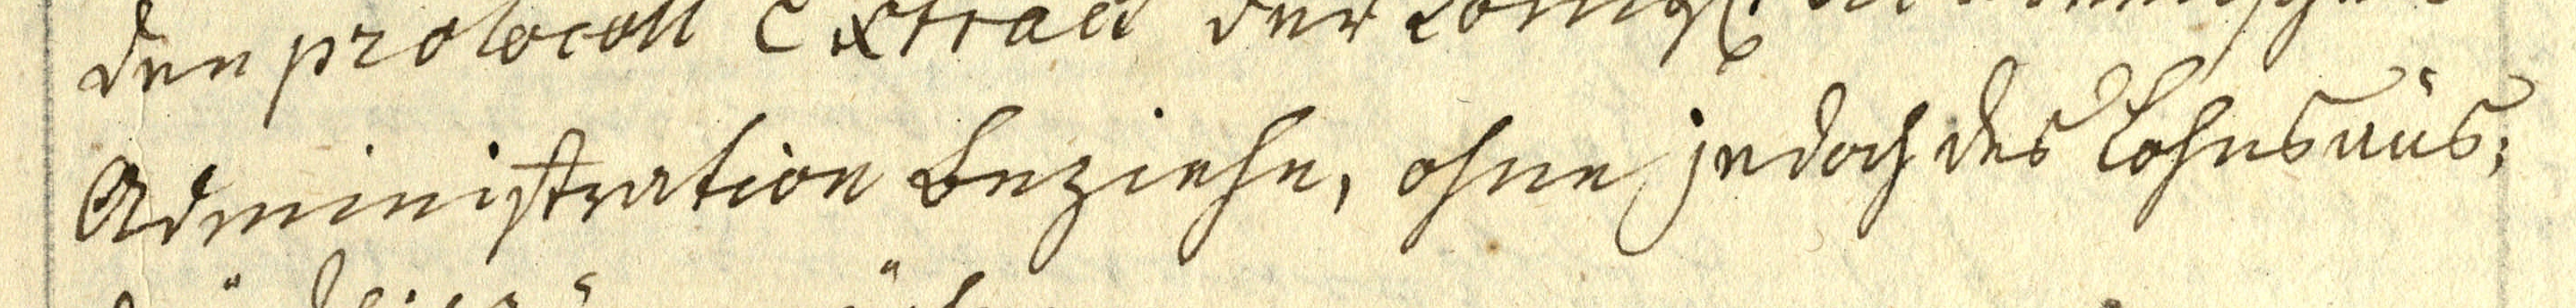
Administration beziehe, ohne jedoch des Lohns aus¬
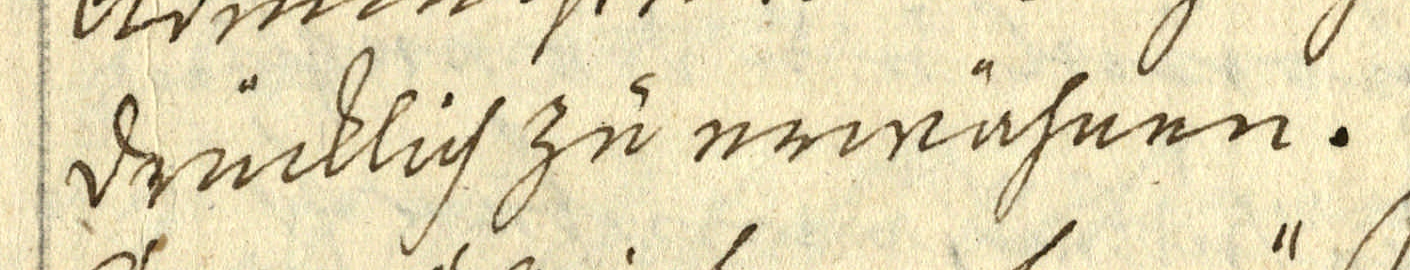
drücklich zu erwähnen.
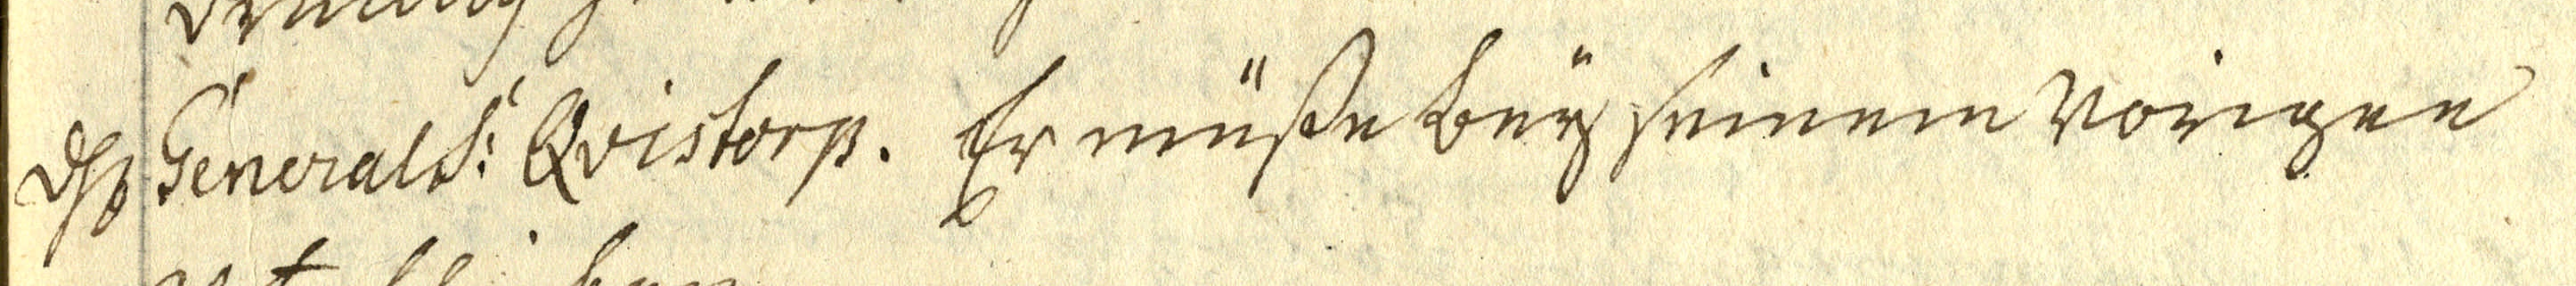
dh GeneralS. Quistorp. Er müße beÿ seinem vorigen
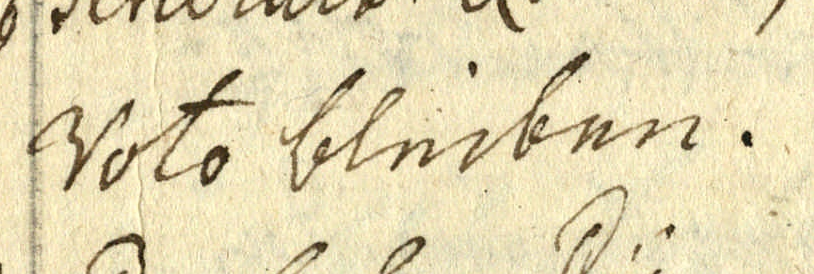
Voto bleiben.
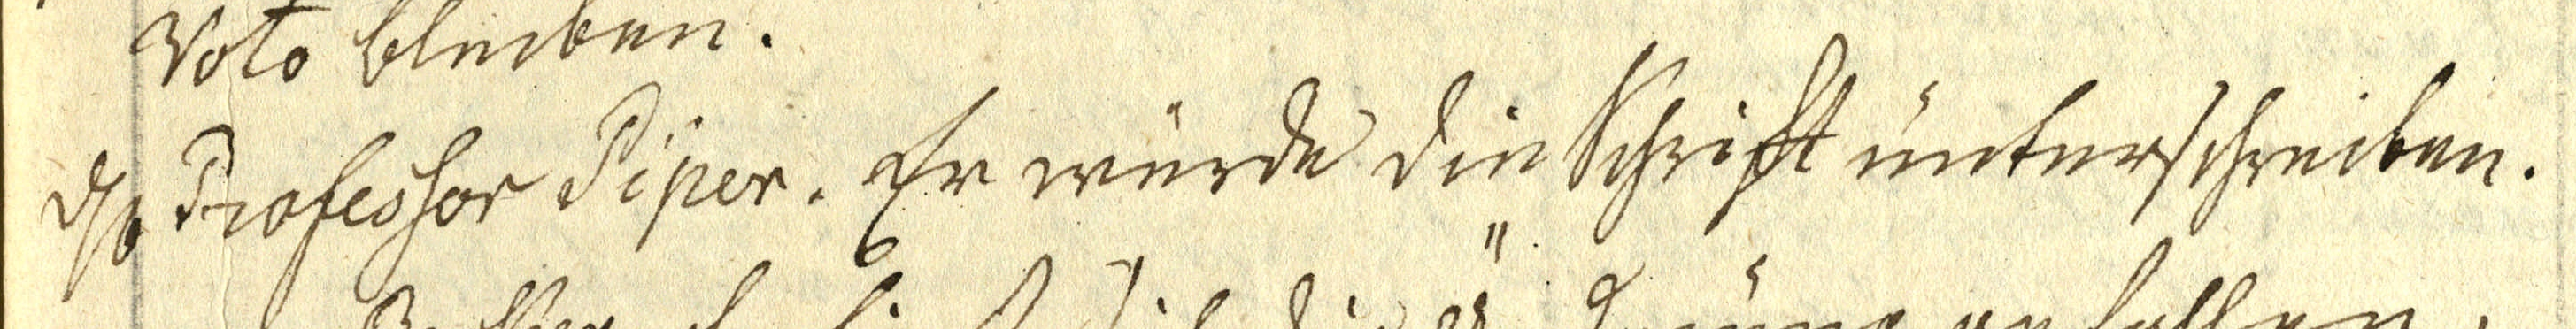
dh Professor Piper. Er würde die Schrift unterschreiben.
